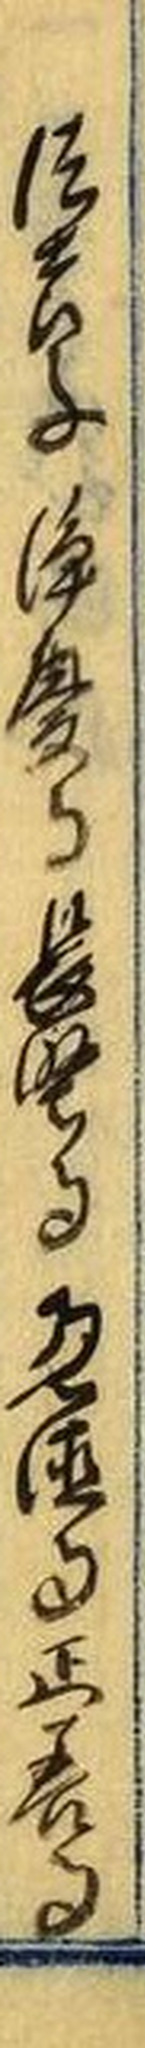法養寺浄慶寺長堅寺恵徳寺正善寺
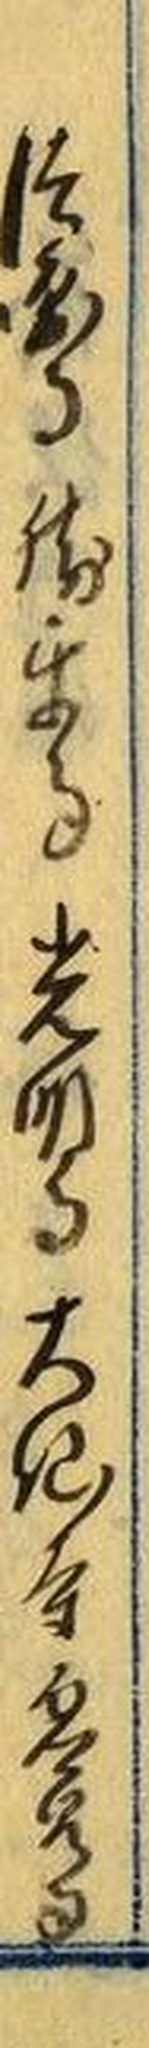法円寺勝楽寺光明寺大仙寺恵雲寺

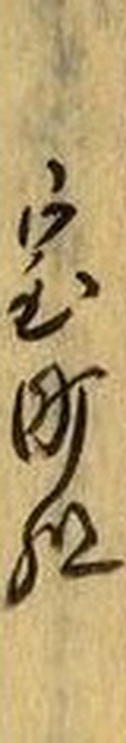宝町組
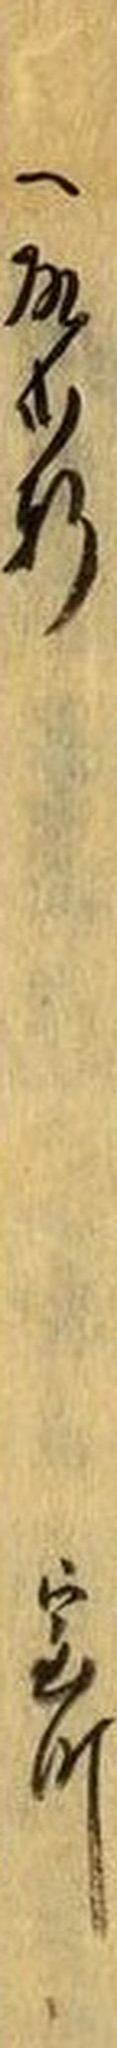一拾弐軒宝町
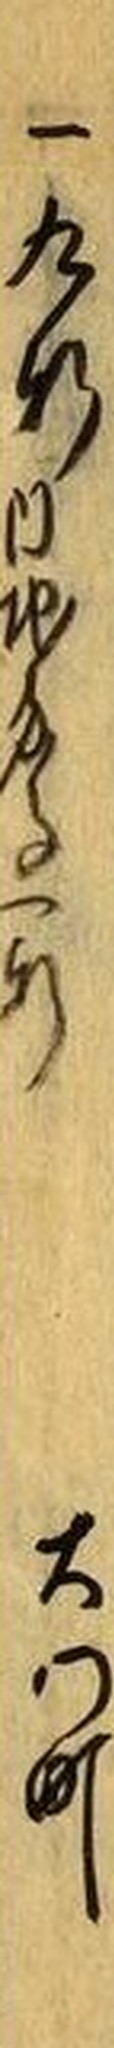一九軒内地名子一軒大門町
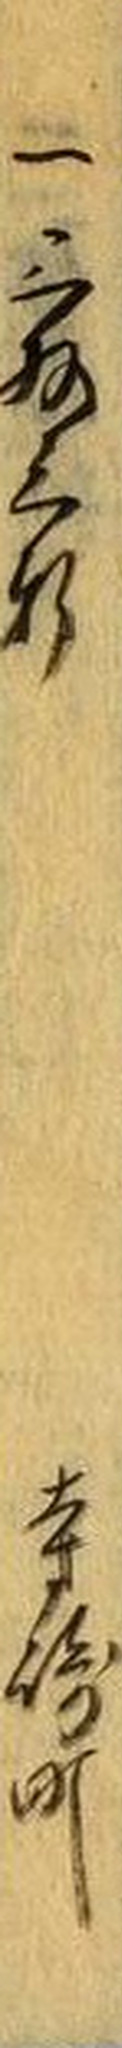一三拾三軒寺崎町
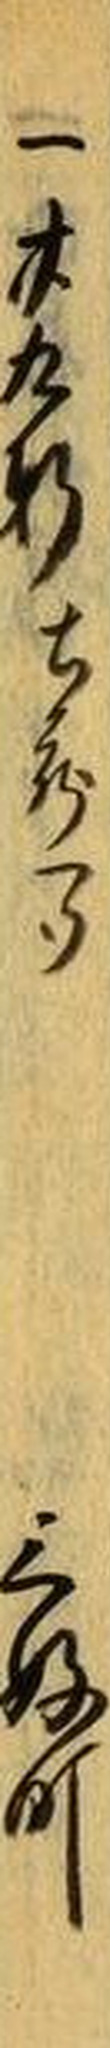一廿九軒土蔵一ッ三好町
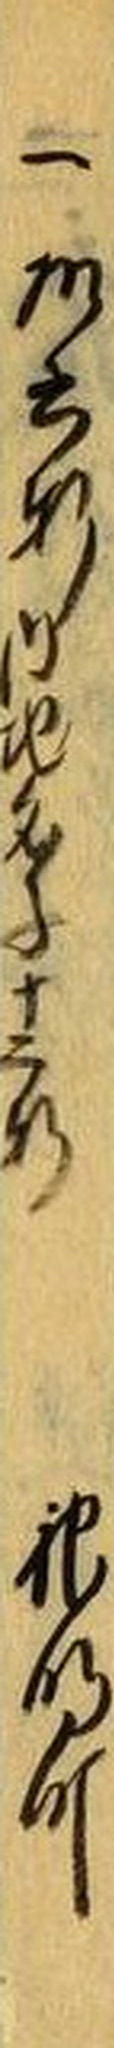一拾六軒内地名子十二軒神明町
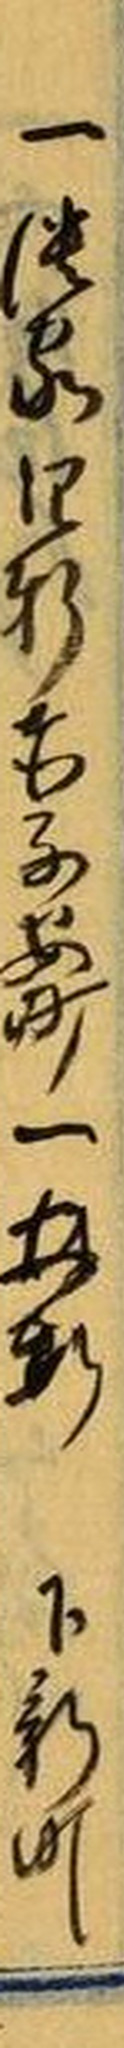一潰家四軒所子安町一五軒下新町
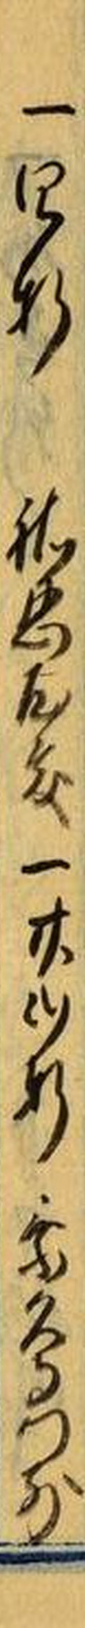一四軒祐恩屋敷一廿弐軒乗久寺門前
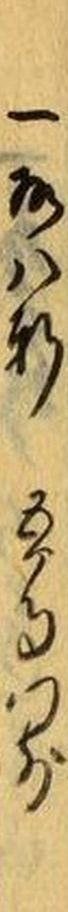一拾八軒五ヶ寺門前
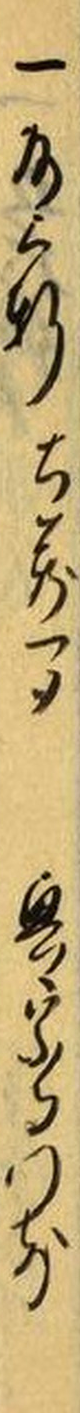一拾三軒土蔵一ッ興宗寺門前
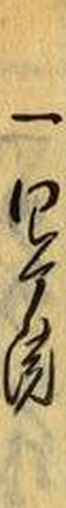一四ヶ院
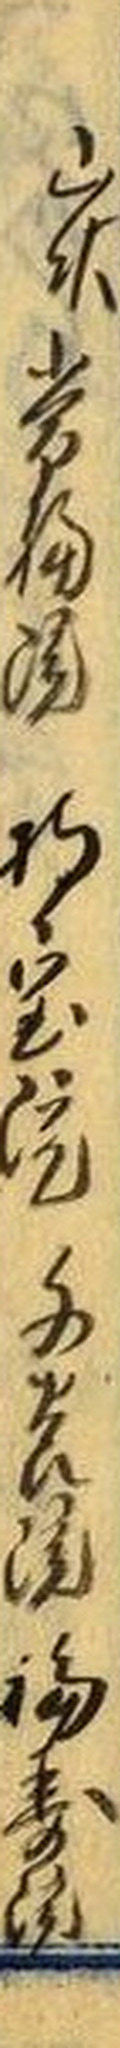山伏常福院持宝院千養院福寿院
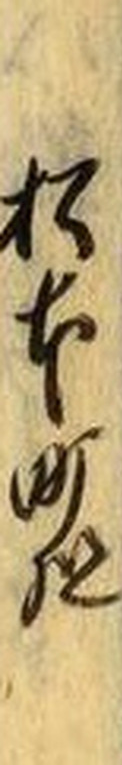松本町組
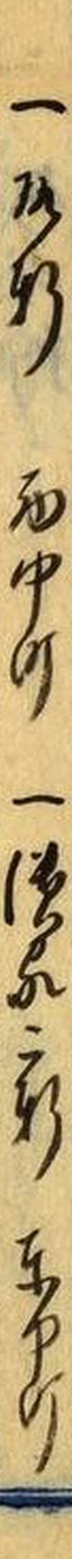一拾軒西中町一潰家三軒東中町
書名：温古集 五巻
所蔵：福井県文書館 Fukui Prefectural Archives
